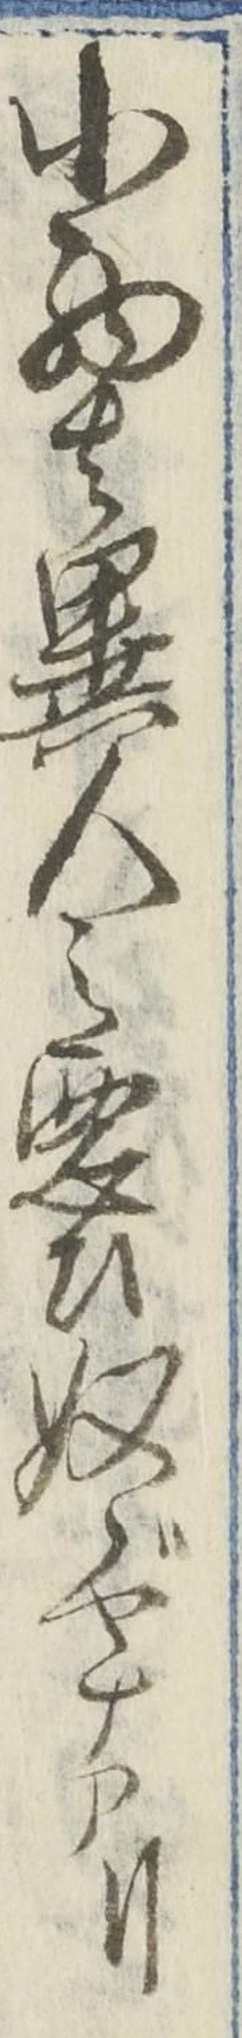小西は異人之悪ひ奴じやナア
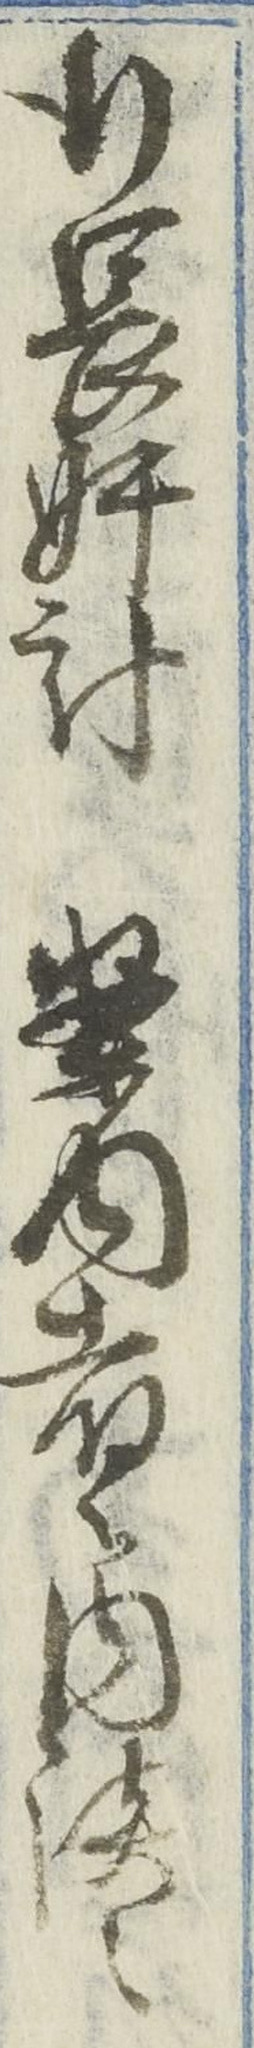行長奸計案内者ニ内談シ
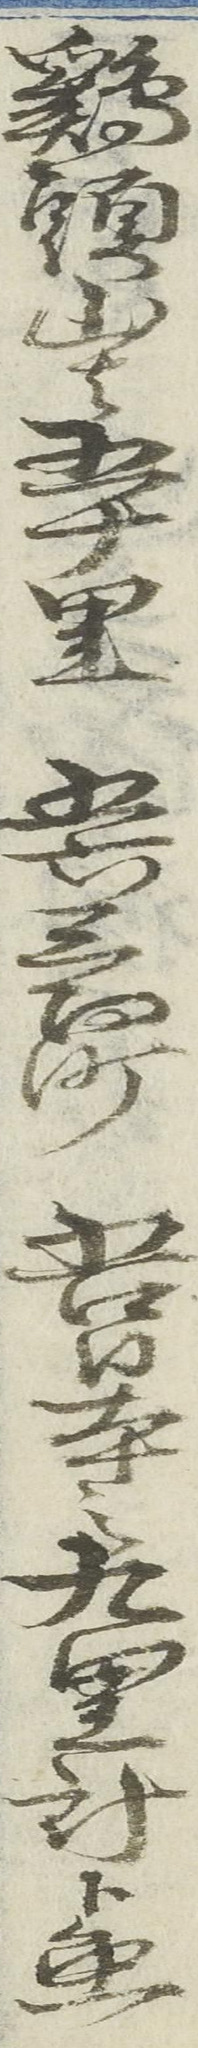鶏頭山は五十里五六三百町吾日本之九里計ト雖
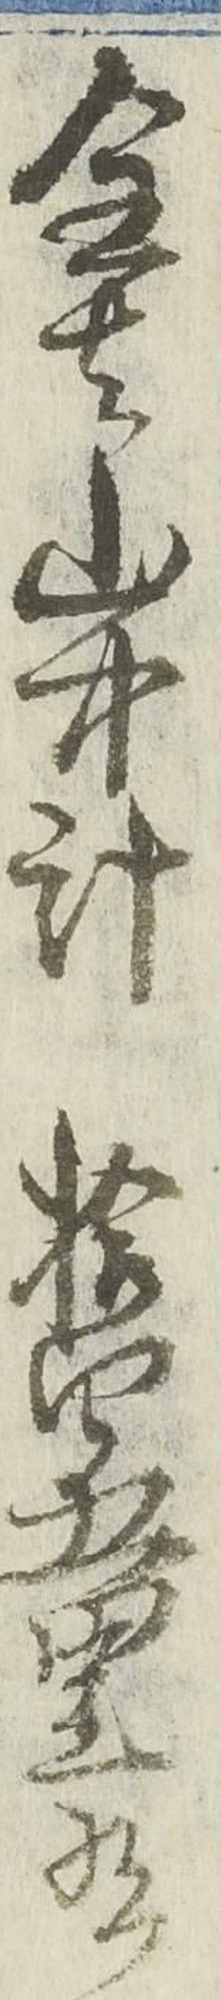全は山中計拾四五里有
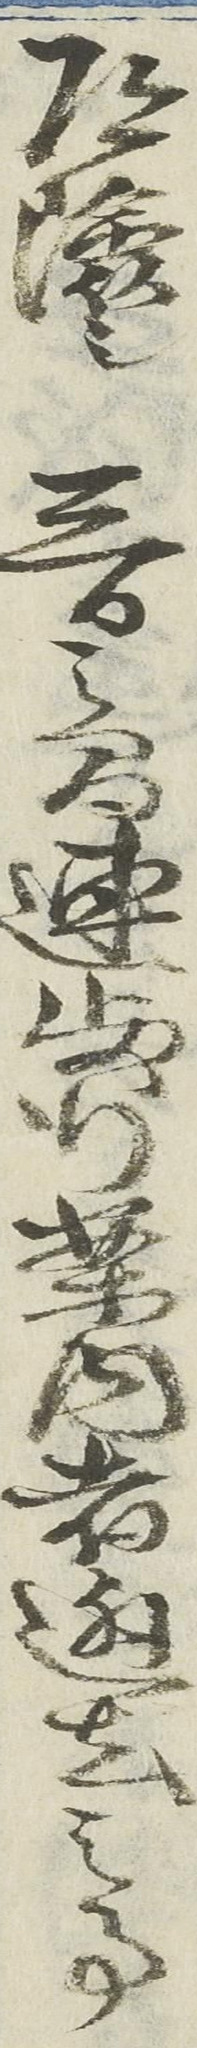道険し三日間連歩行案内者逃去之事
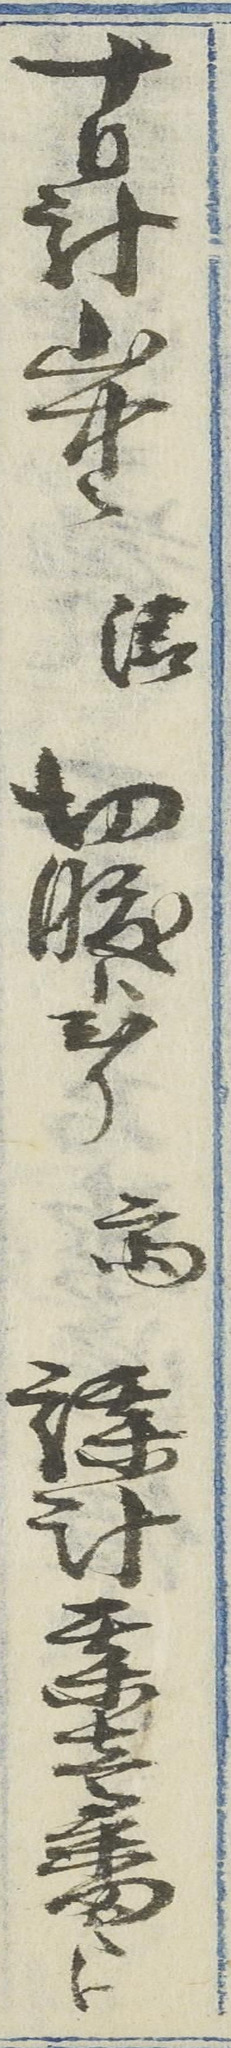十日計山中也清切腹ト云ウ斉謀計某壱番ト
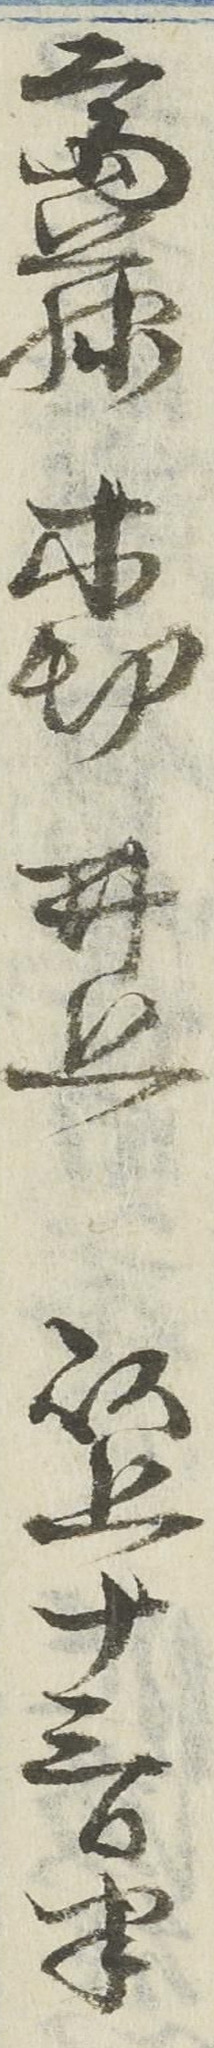斉藤木邨井上以上十三日半
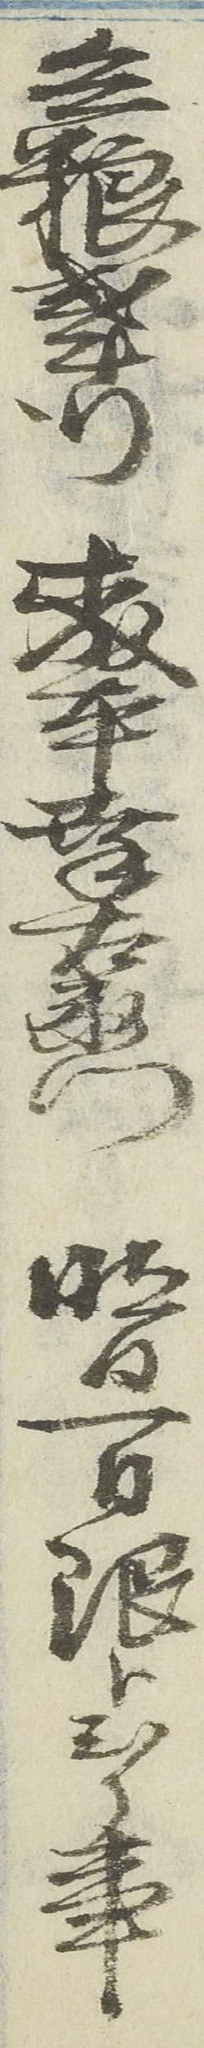兵粮奉行森本幸右衛門明日一日限ト云ウ事

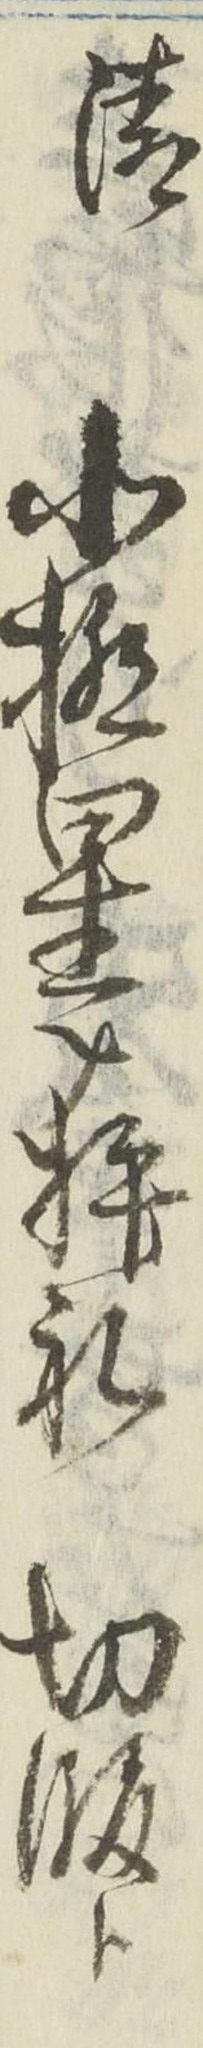清北極星ヲ拝礼切腹ト
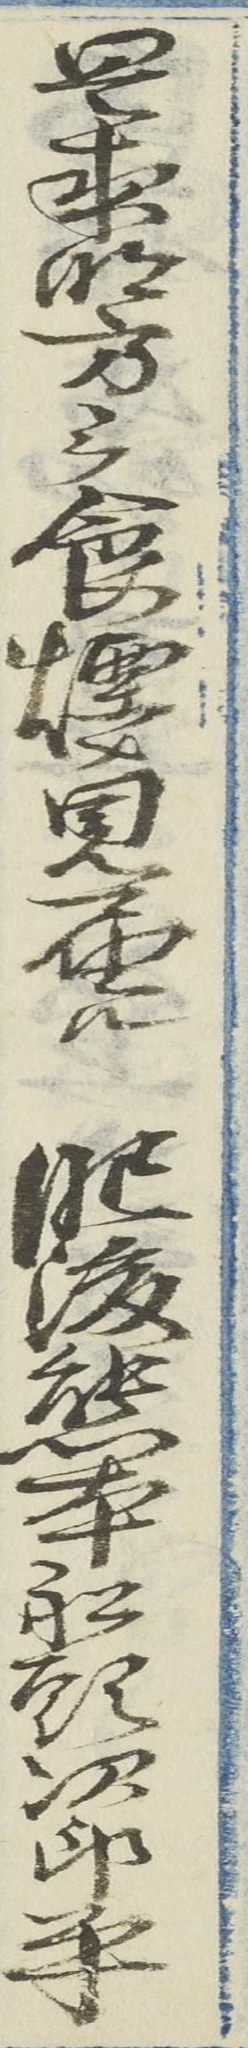是夜明方ニテ食煙ヲ見届ル肥後熊本船頭次郎平
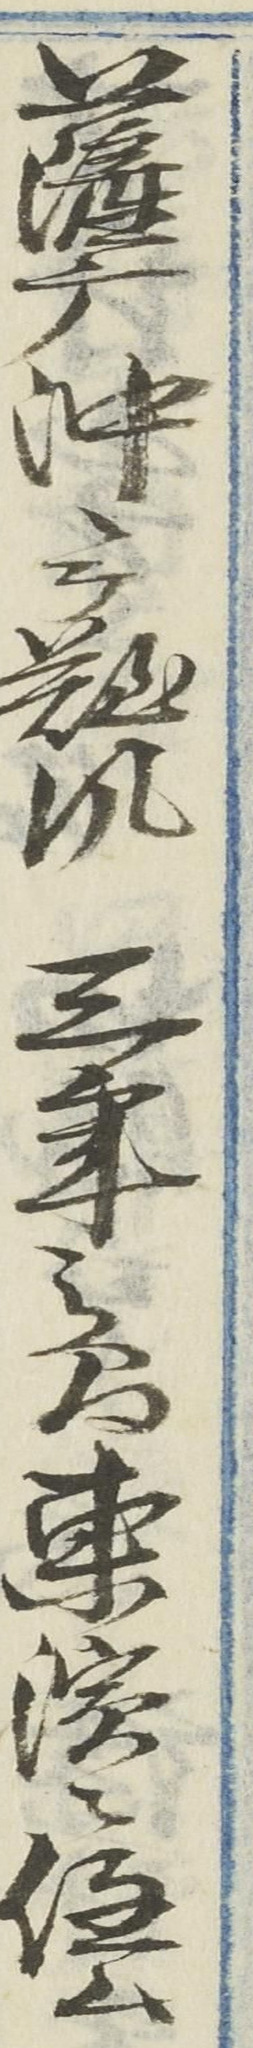薩摩沖ニテ難風三年之間東濱ニ住ム
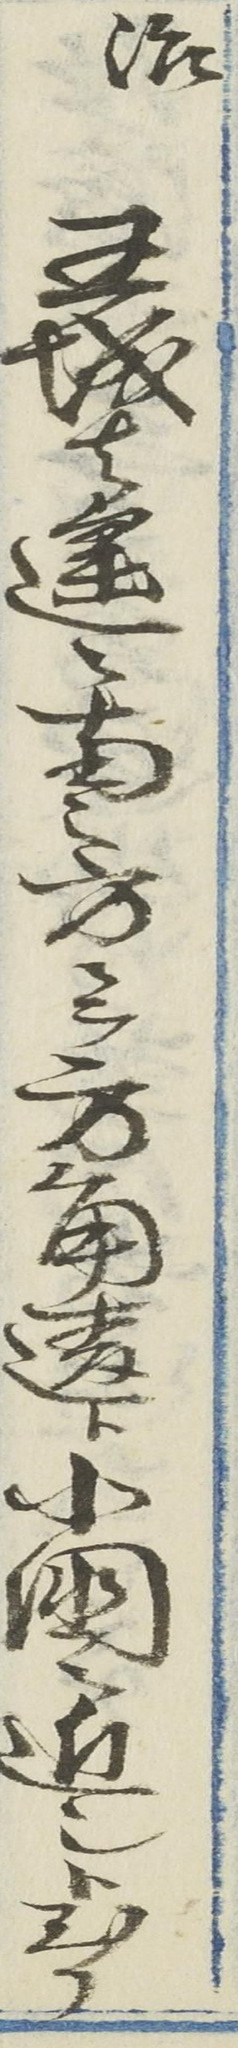作王城は遙ニ南之方ニテ方角違ト北国ニ近シト云ウ
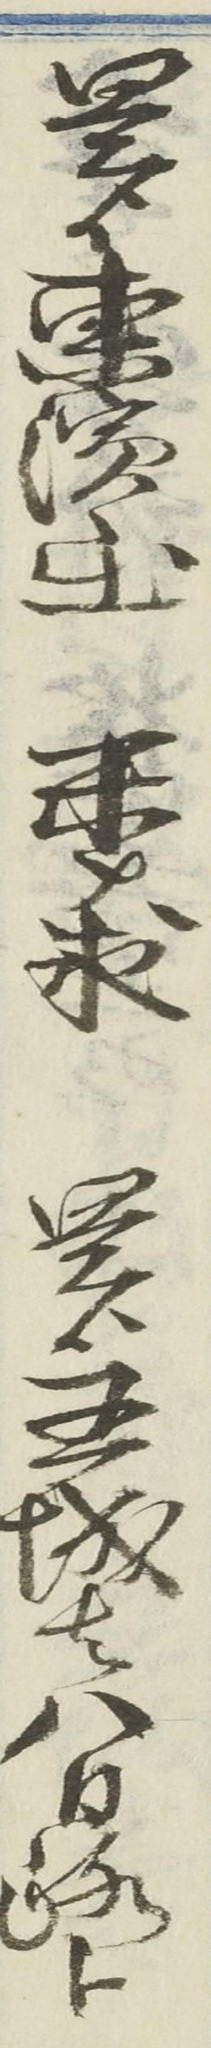是ゟ東濱出米ヲ求是ゟ王城は八日路ト
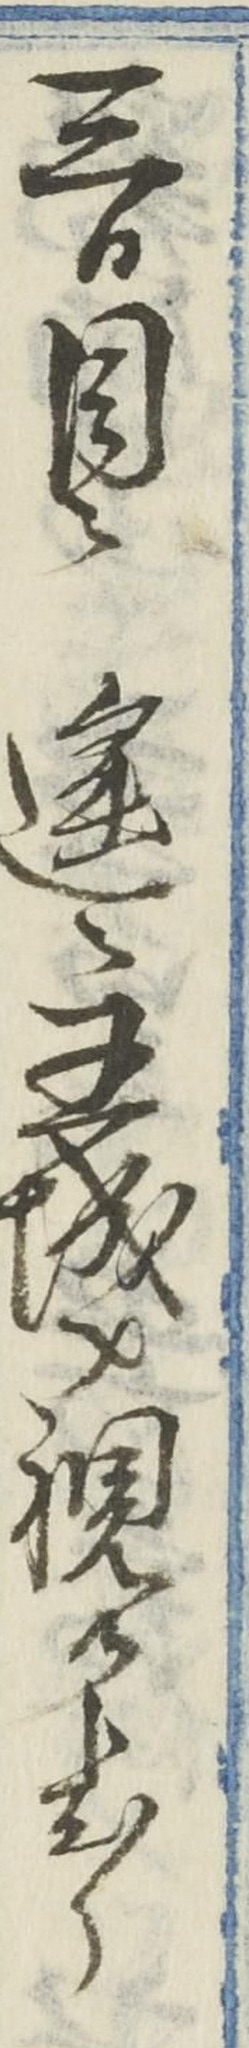三日目ニ遙ニ王城ヲ視ルト云ウ
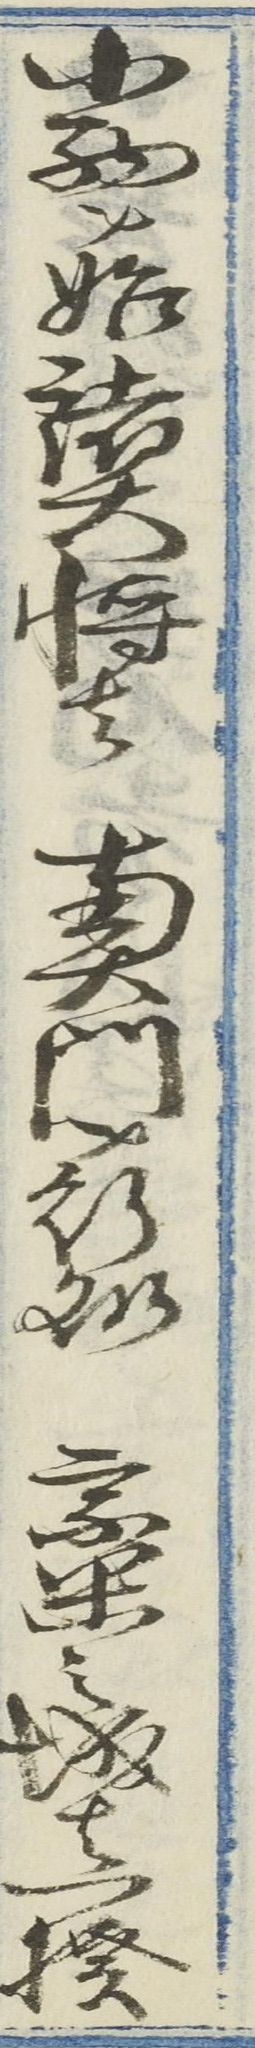小西ヲ始諸大将は南大門ヲ行処宗果之城は一揆
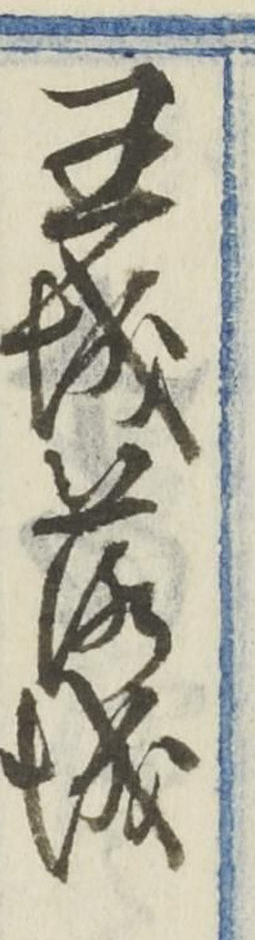王城落城
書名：伏水大地震
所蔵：東京大学地震研究所図書室 Earthquake Research Institute Library, The University of Tokyo, JAPAN
